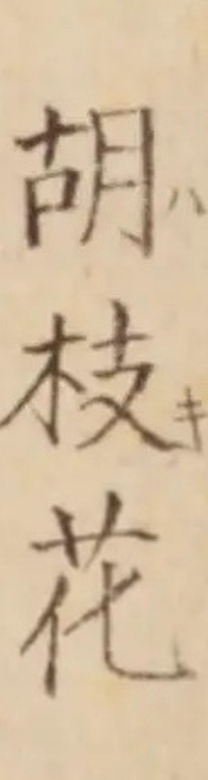胡枝花
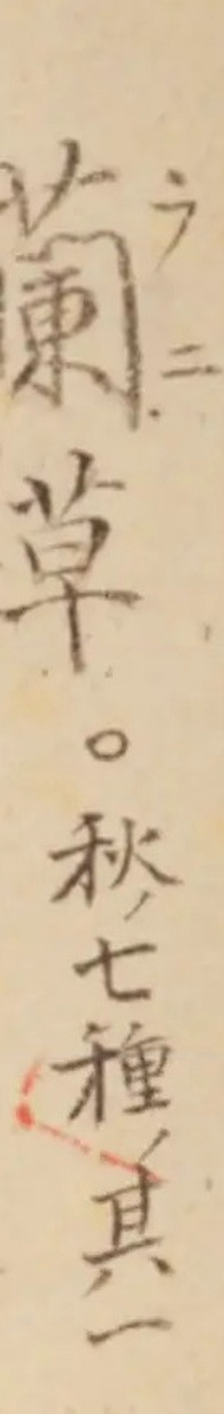蘭草◦秋七種其一
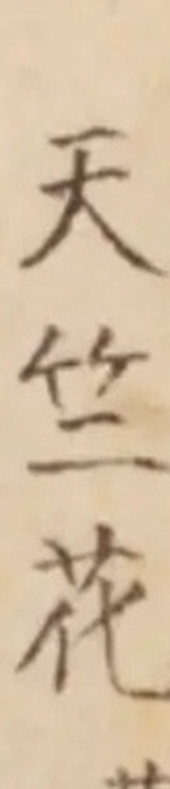天竺花
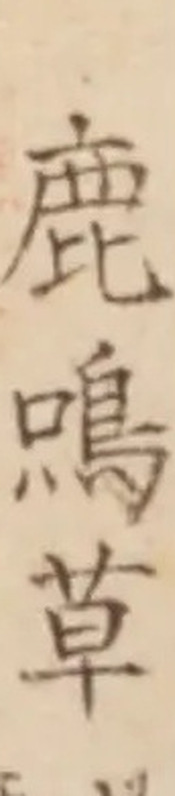鹿鳴草
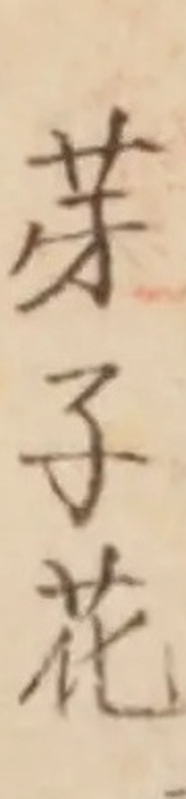芽子花
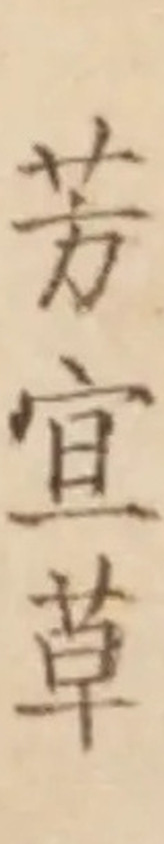芳宜草
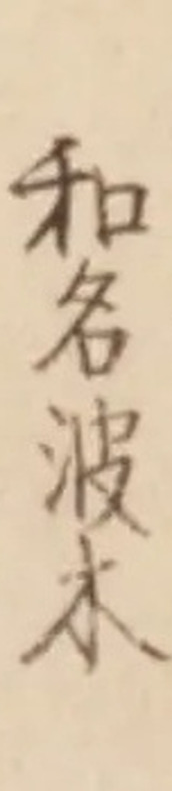和名波木
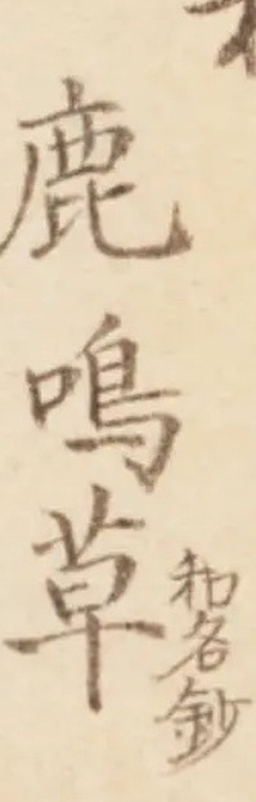鹿鳴草
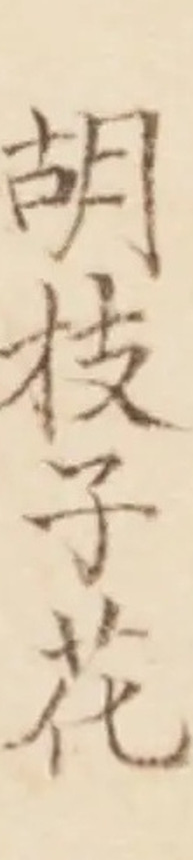胡枝子花
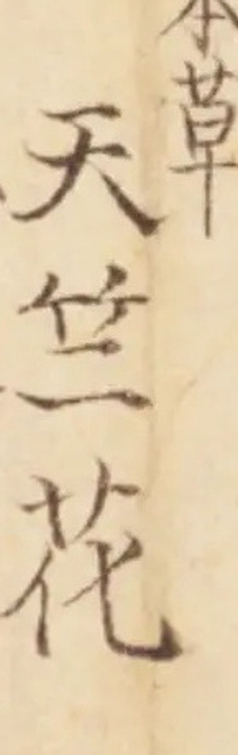天竺花
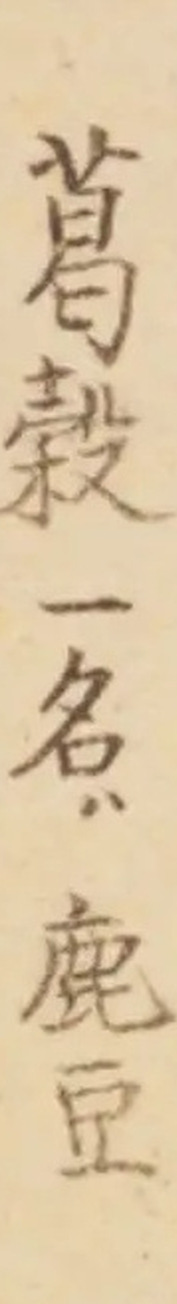葛穀一名鹿豆
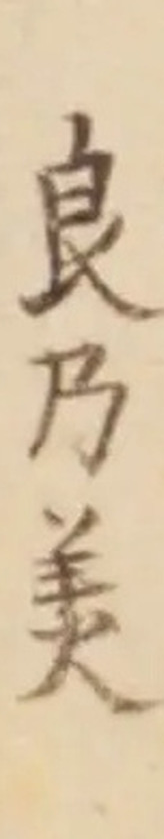良及美

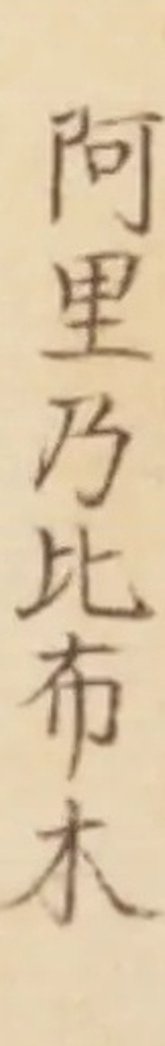阿里乃比布木
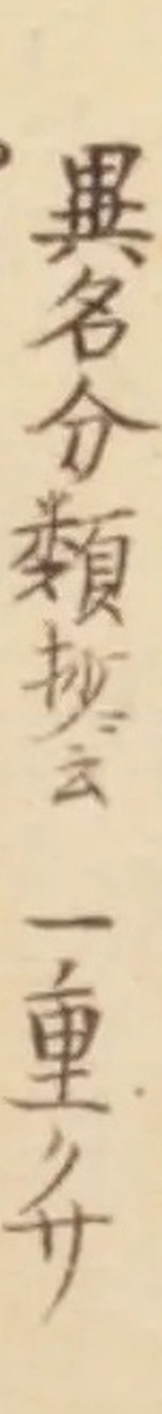異名分類抄云一重クサ
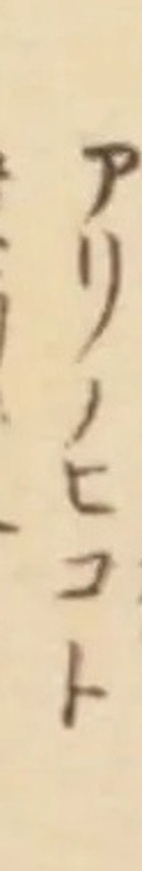アリノヒコト
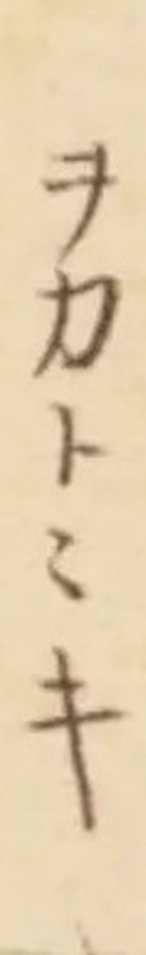ヲカト〻キ
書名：梅園草木花譜秋之部. 1
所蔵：国立国会図書館 National Diet Library, JAPAN
